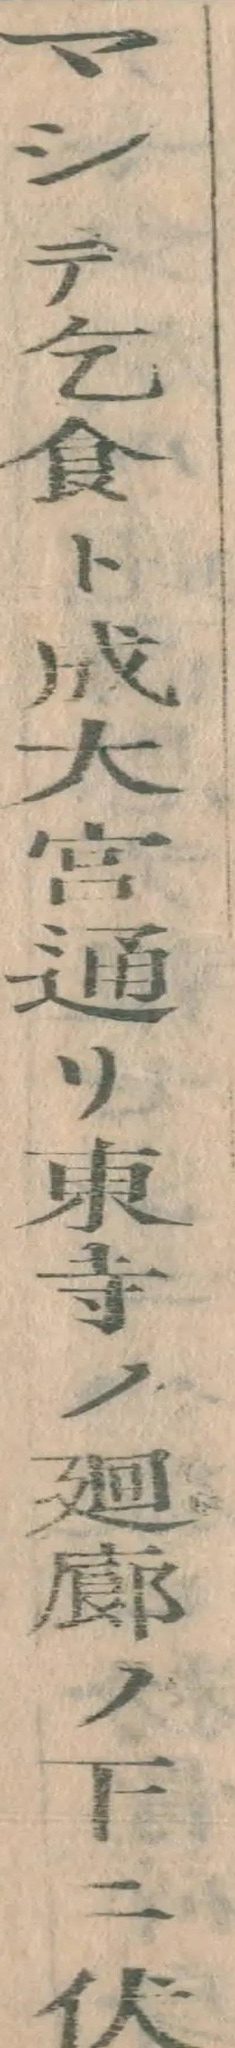マシテ乞食ト成大宮通リ東寺ノ廻廊ノ下ニ伏
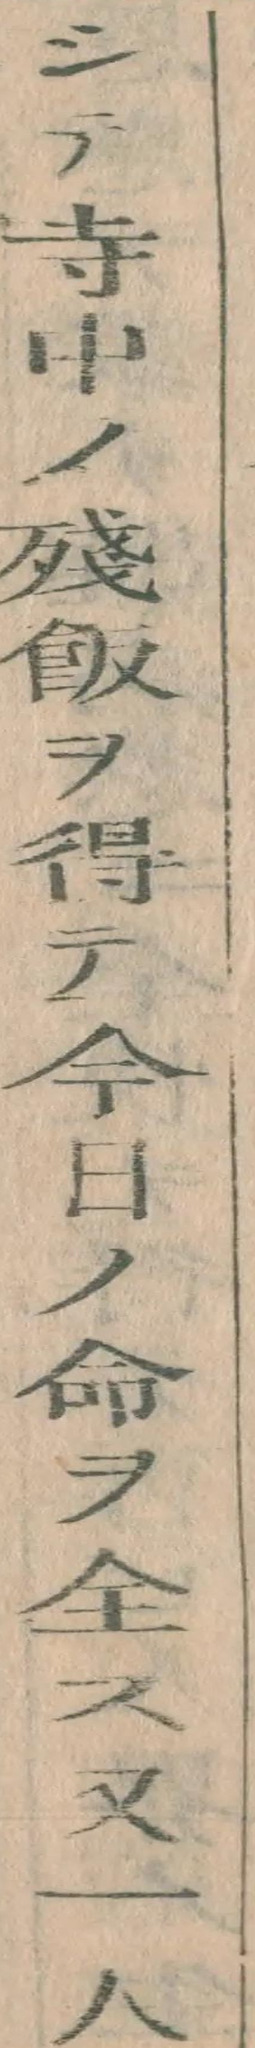シテ寺中ノ残飯ヲ得テ今日ノ命ヲ全ス又一人
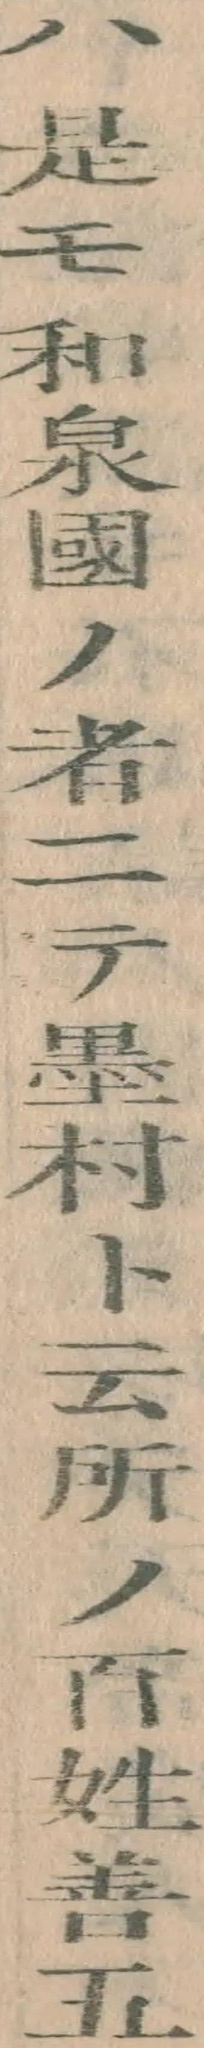ハ是モ和泉国ノ者ニテ墨村ト云所ノ百姓善五
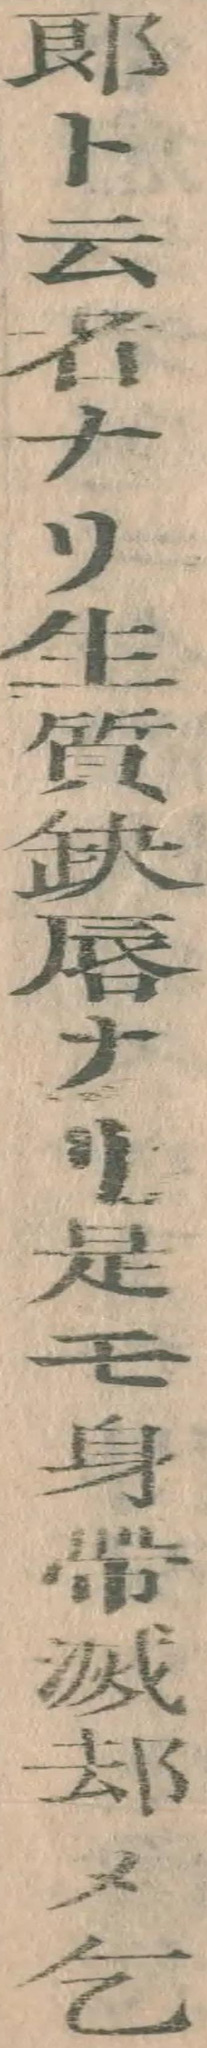郎ト云者ナリ生質欠唇ナリ是モ身帯滅却シテ乞
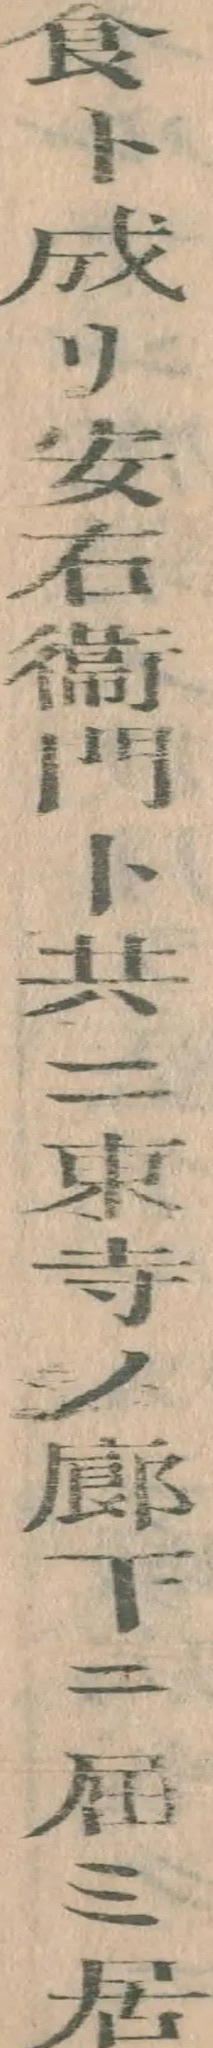食ト成リ安右衛門ト共ニ東寺ノ廊下ニ屈ミ居
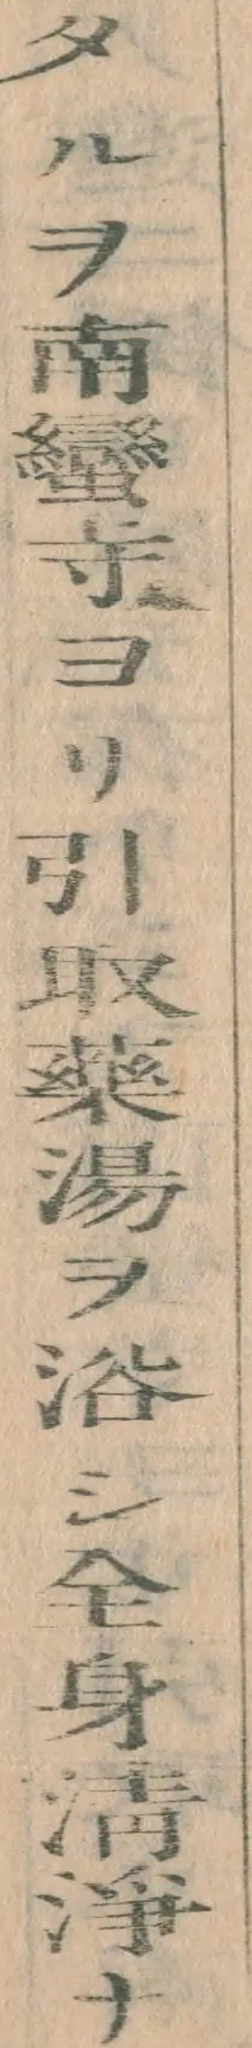タルヲ南蛮寺ヨリ引取薬湯ヲ浴シ全身清浄ナ
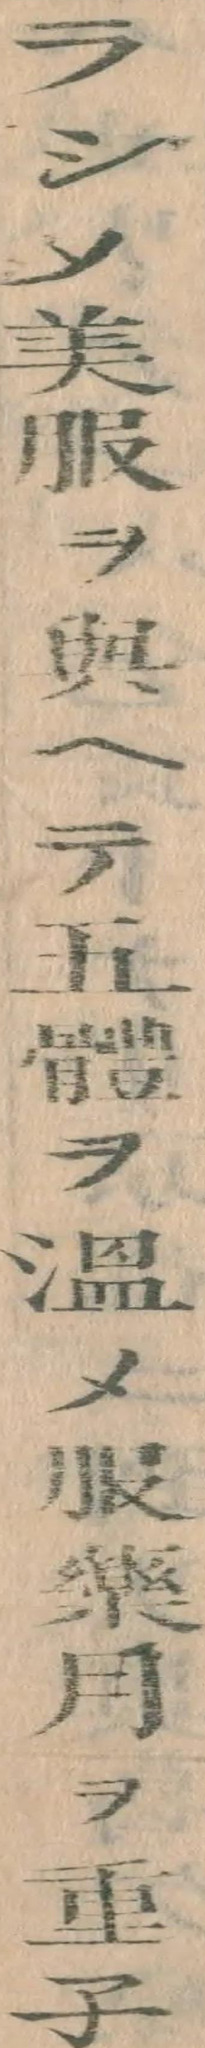ラシメ美服ヲ与ヘテ五体ヲ温メ服薬月ヲ重ネ
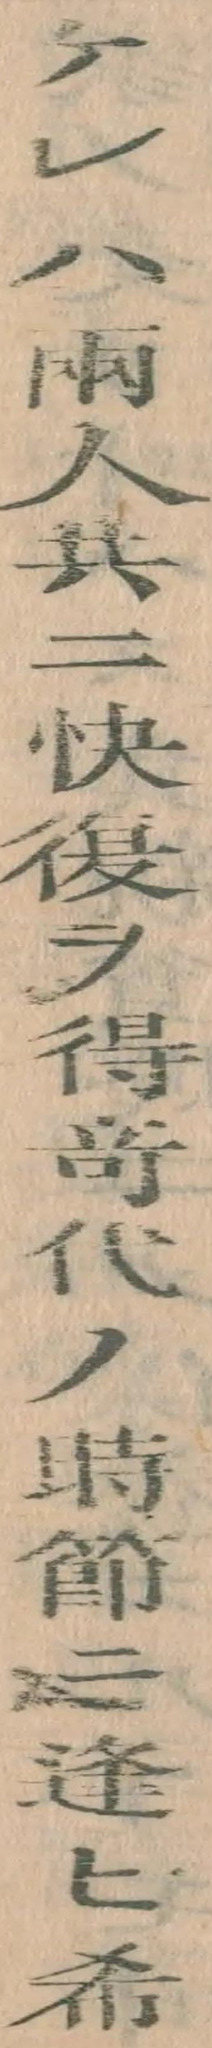ケレハ両人共ニ快復ヲ得奇代ノ時節ニ逢ヒ希
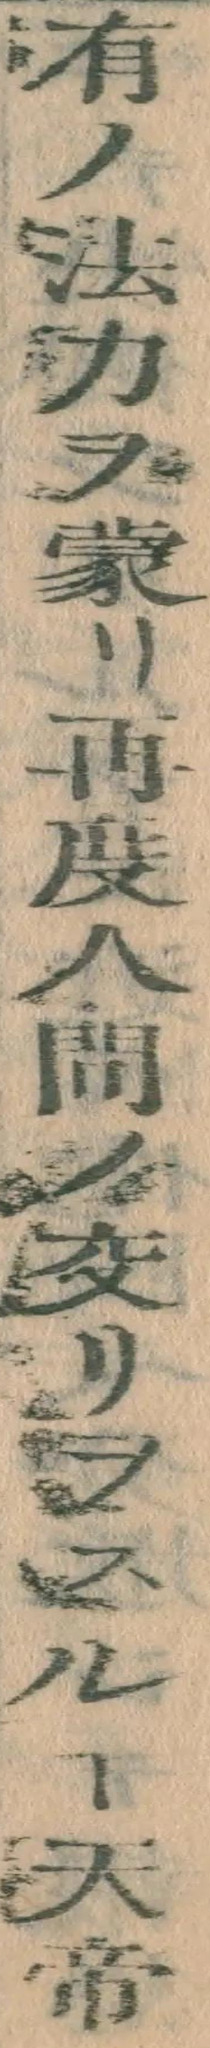有ノ法力ヲ蒙リ再度人間ノ交リヲスルヿ天帝
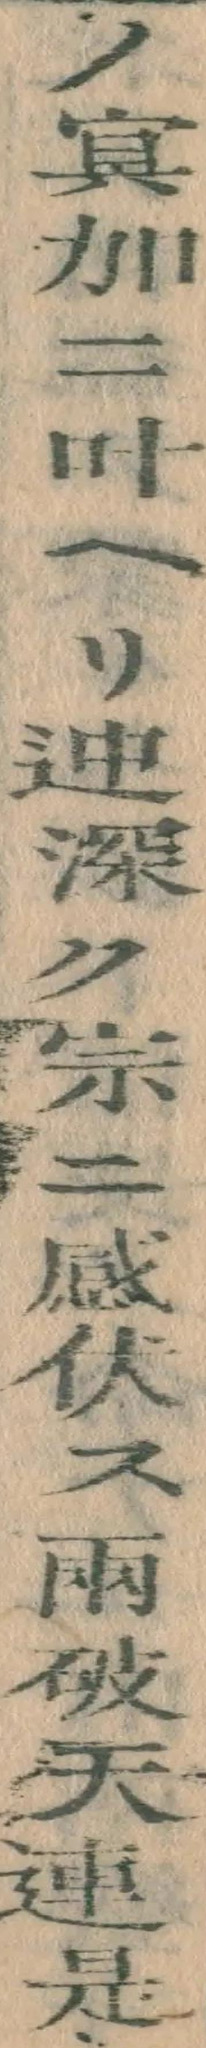ノ冥加ニ叶ヘリ迚深ク宗ニ感伏ス両破天連是
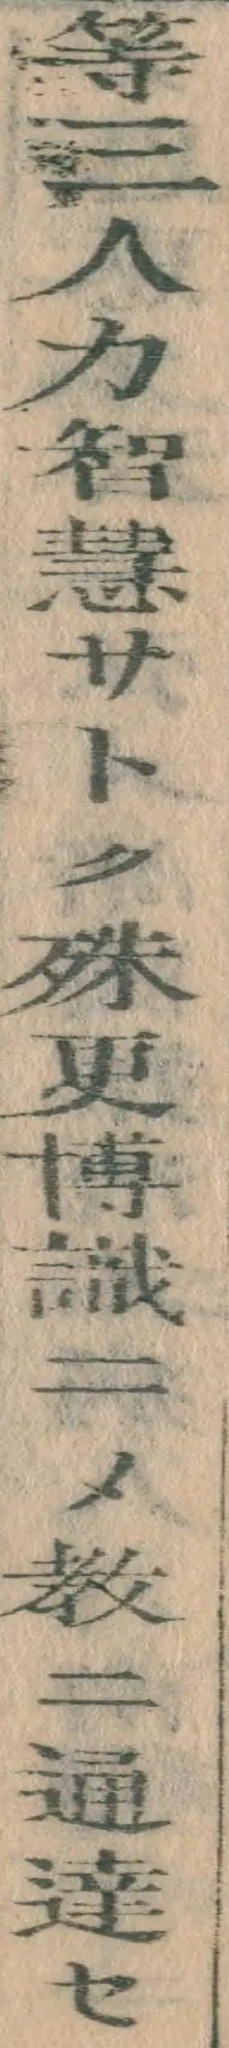等三人力智慧サトク殊更博識ニシテ教ニ通達セ
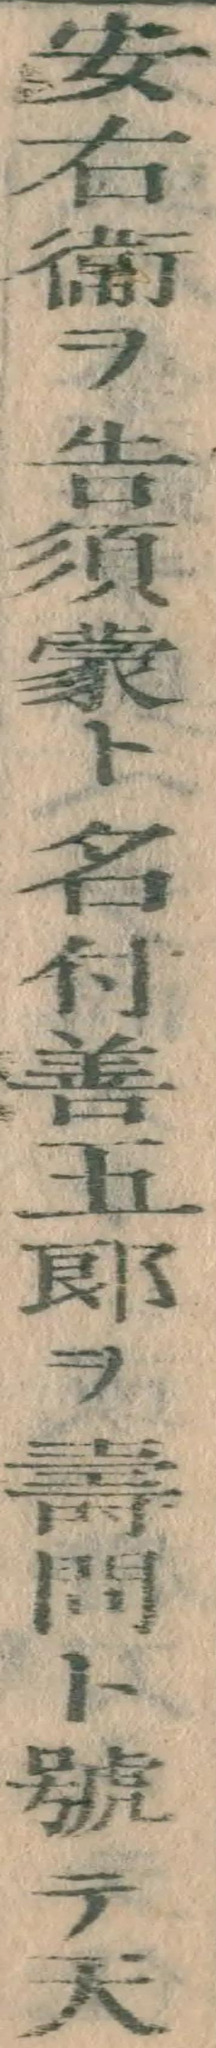安右衛ヲ告須蒙ト名付善五郎ヲ寿問ト号テ天
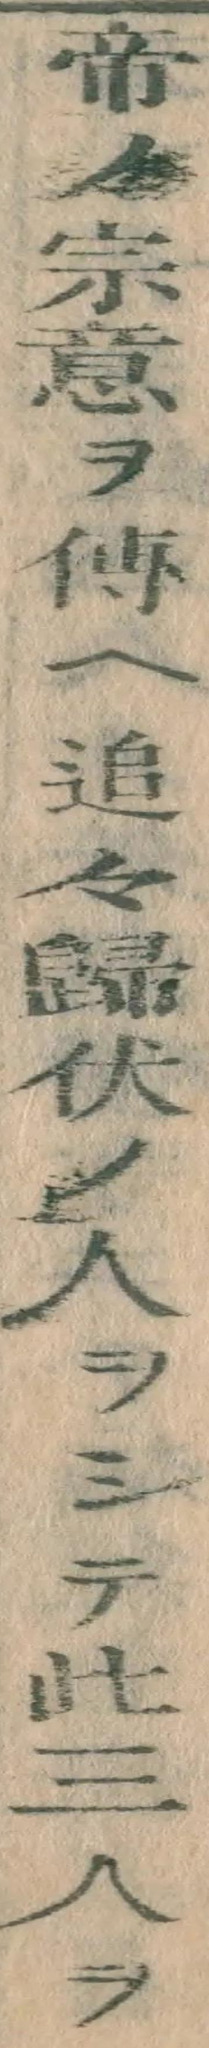帝ノ宗意ヲ伝ヘ追々帰伏ノ人ヲシテ此三人ヲ
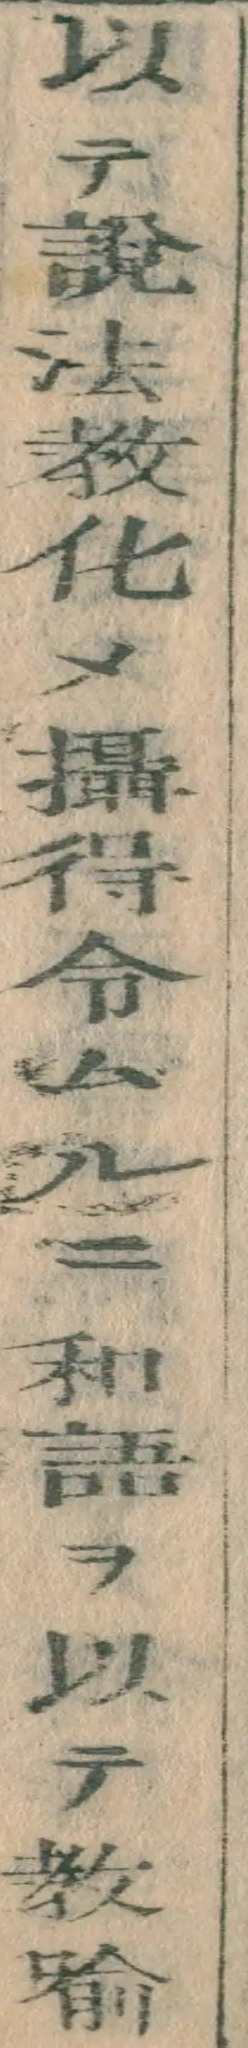以テ説法教化シテ摂得令ムルニ和語ヲ以テ教喩
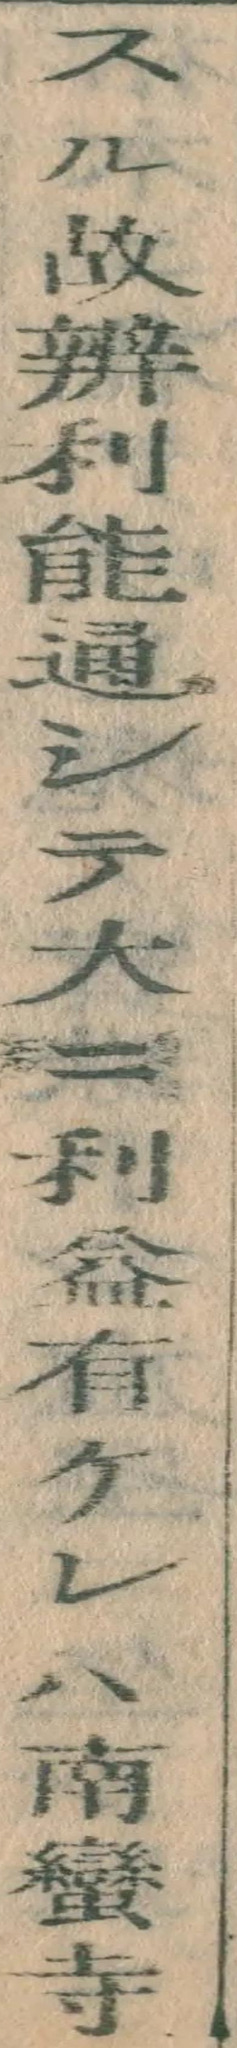スル故弁利能通シテ大ニ利益有ケレハ南蛮寺
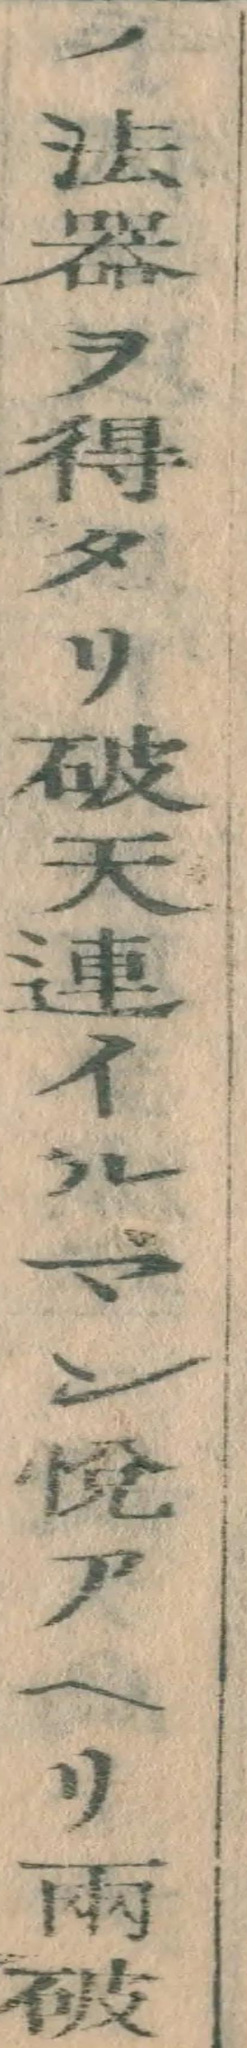ノ法器ヲ得タリ破天連イルマン悦アヘリ両破
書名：南蛮寺興廃記
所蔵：国立国会図書館 National Diet Library, JAPAN
